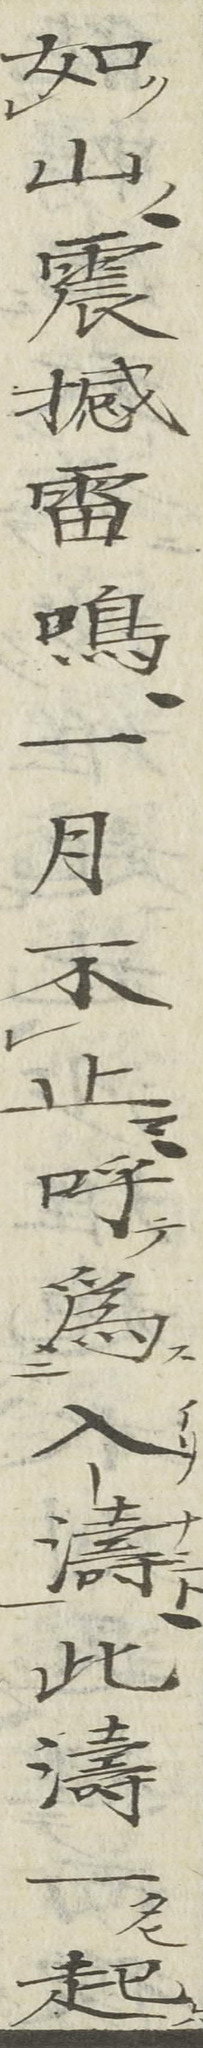如山、震撼雷鳴、一月不止、呼為入濤、此濤一起
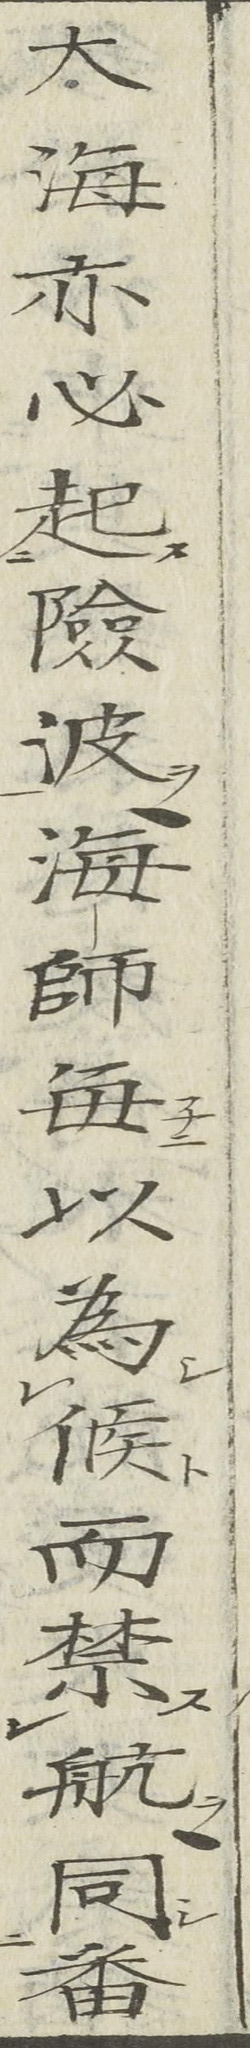太海亦必起険波、海師毎以為候而禁航、同番
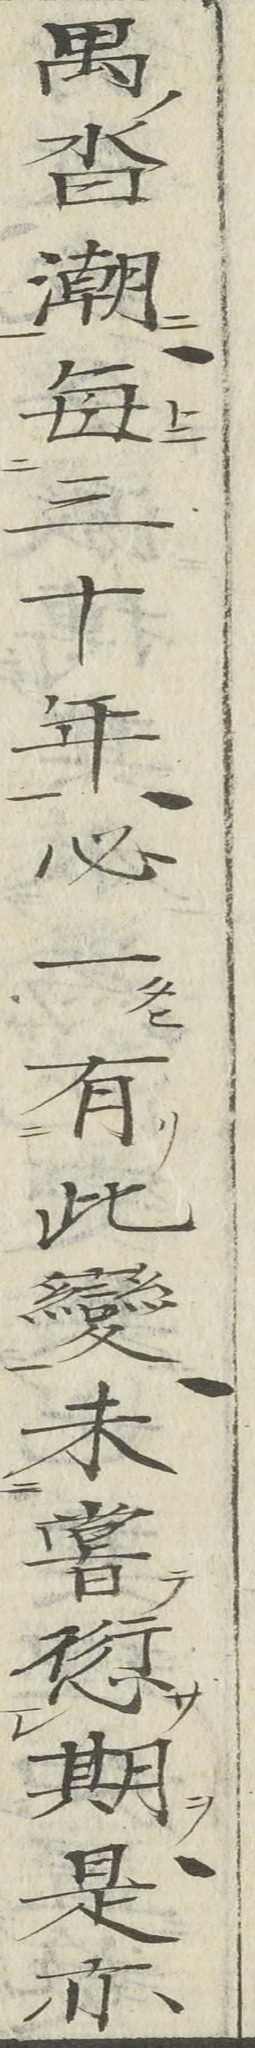禺沓潮、毎三十年、必一有此変、未嘗愆期、是亦
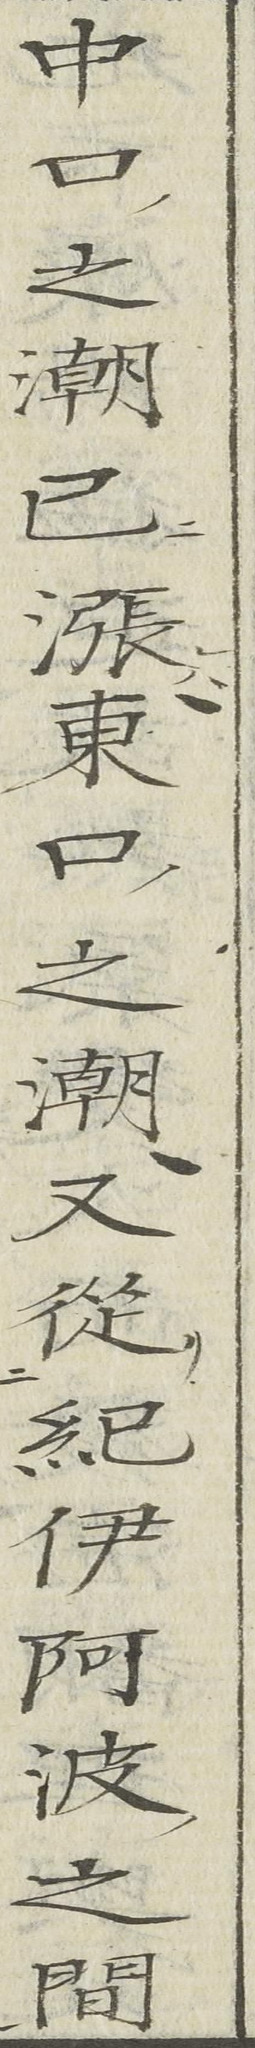中口之潮已漲、東口之潮、又従紀伊阿波之間
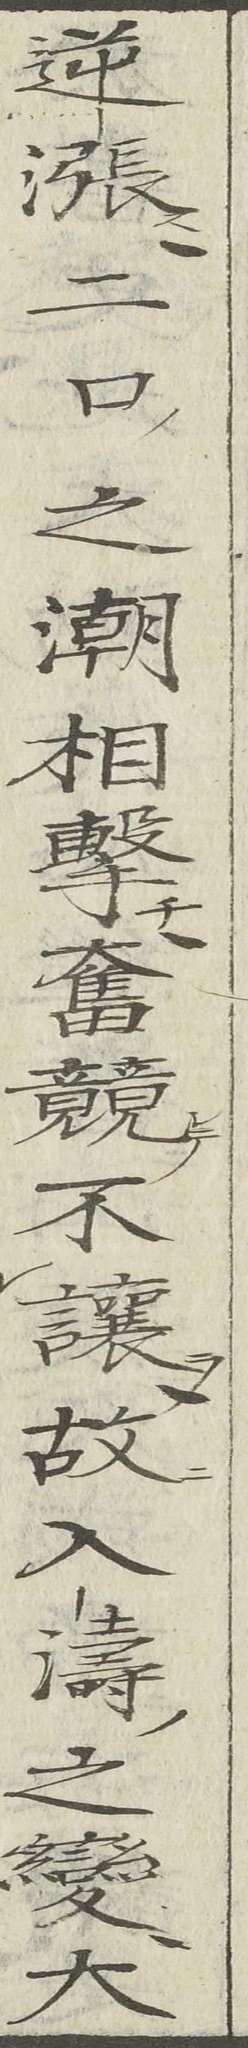逆漲、二口之潮相撃、奮競不譲、故入濤之変、大
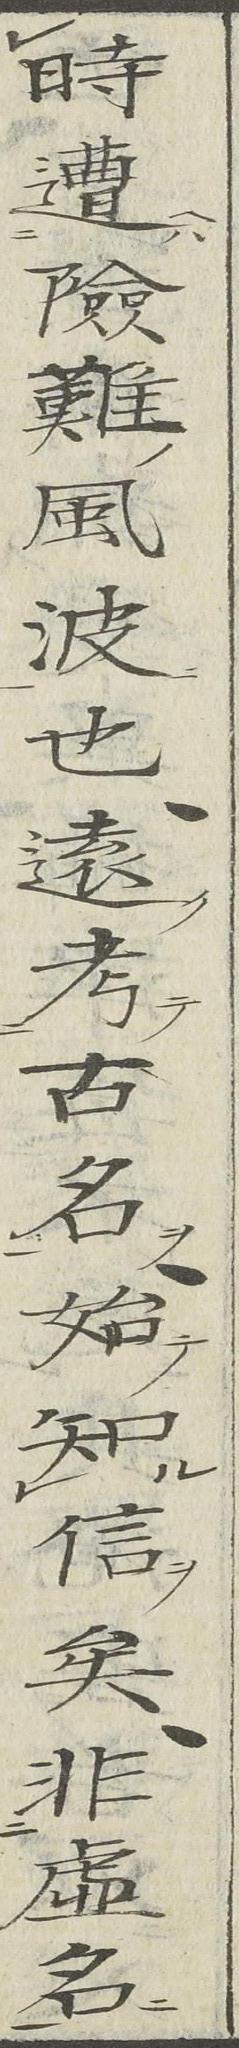時遭険難風波也、遠考古名、始知信矣、非虚名

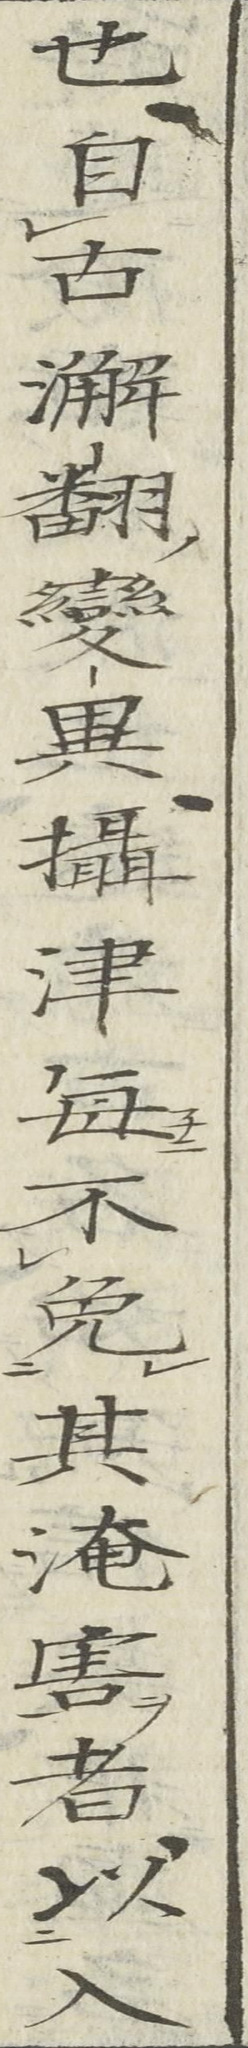也、自古溯翻変異、摂津毎不免其淹害者、以入
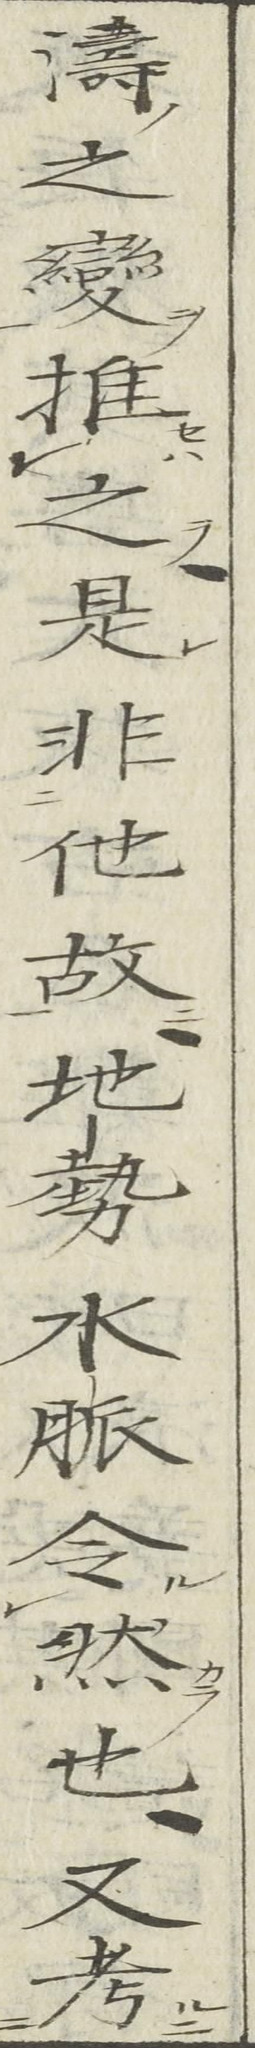濤之変推之、是非他故、地勢水脈令然也、又考
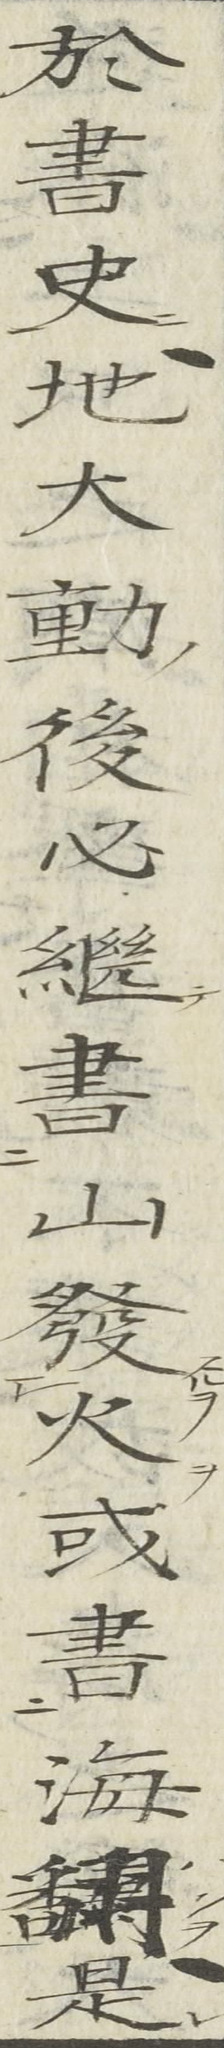於書史、地大動後必継書山発火或書海翻、是
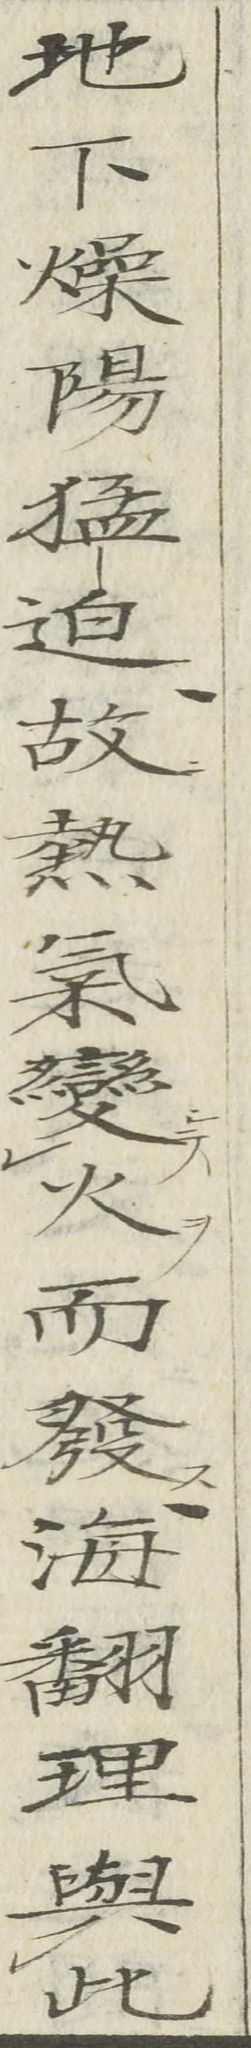地下燥陽猛迫、故熱気変火而発、海翻理与此
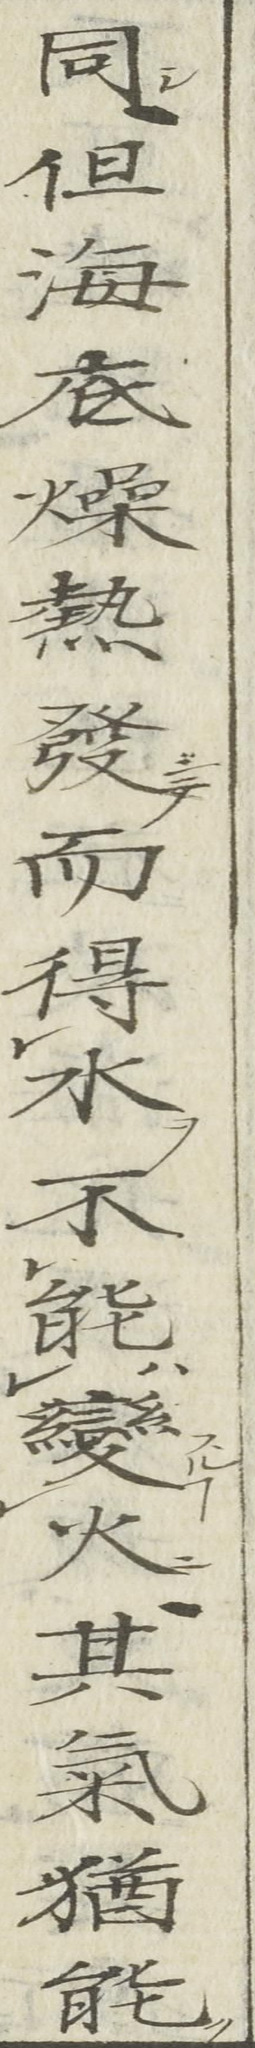同、但海底燥熱発而得水不能変火、其気猶能
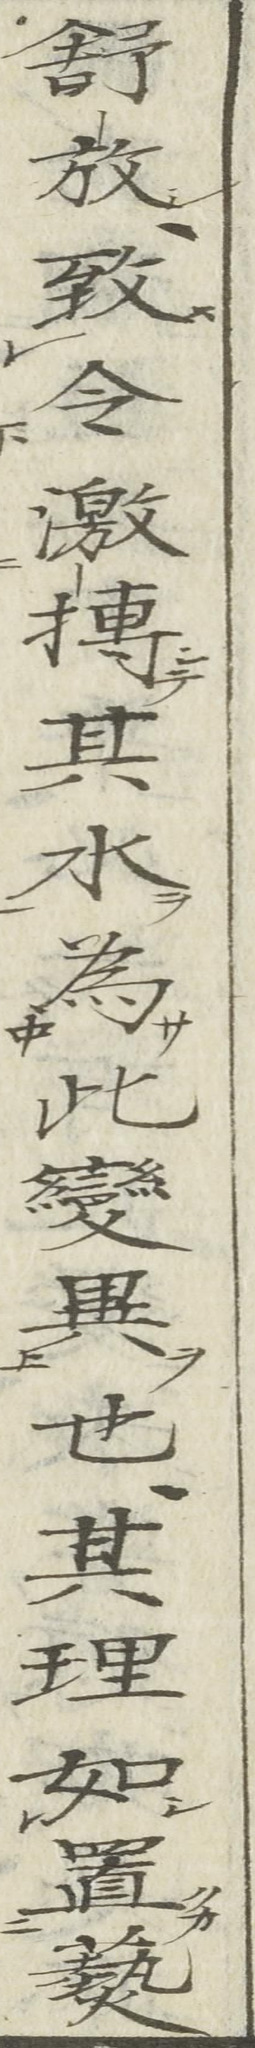舒放、致令激摶其水為此変異也、其理如置爇
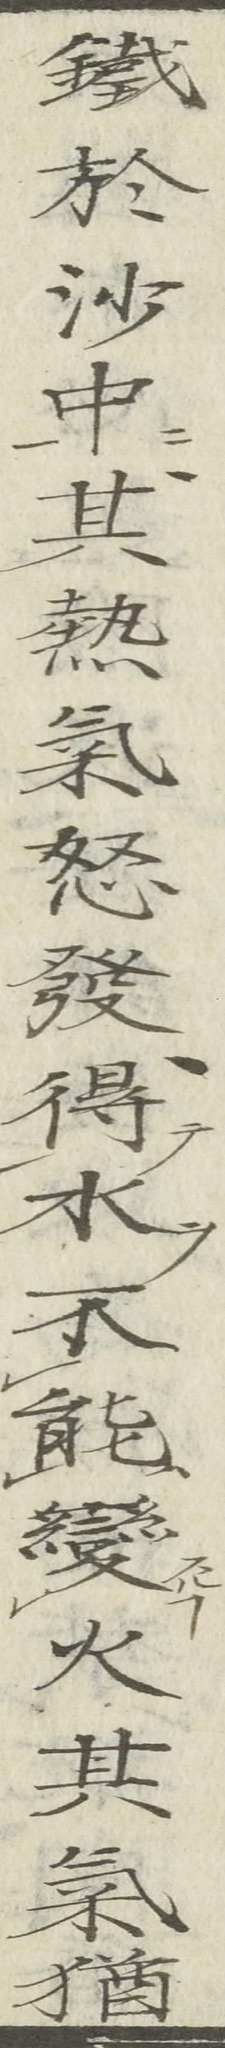鉄於沙中、其熱気怒発、得水不能変火其気猶
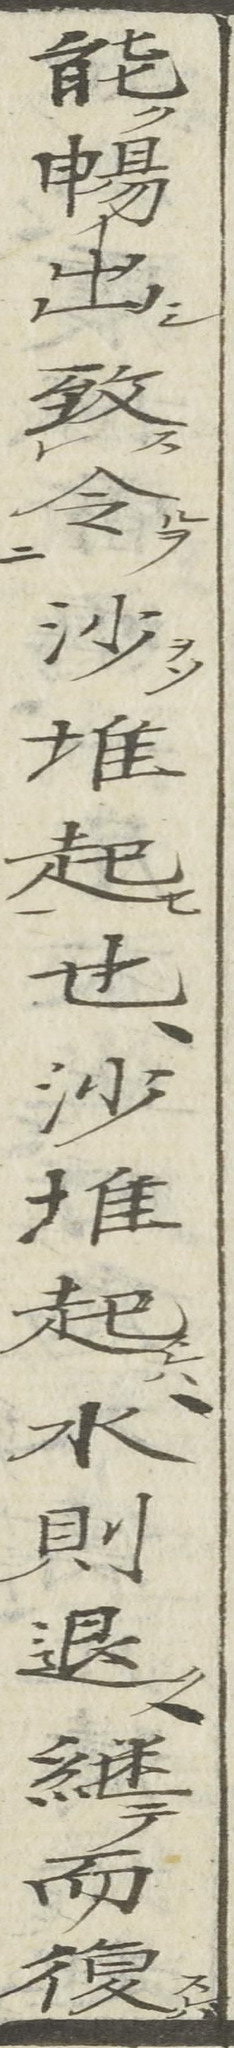能暢出致令沙堆起也、沙堆起、水則退、継而復
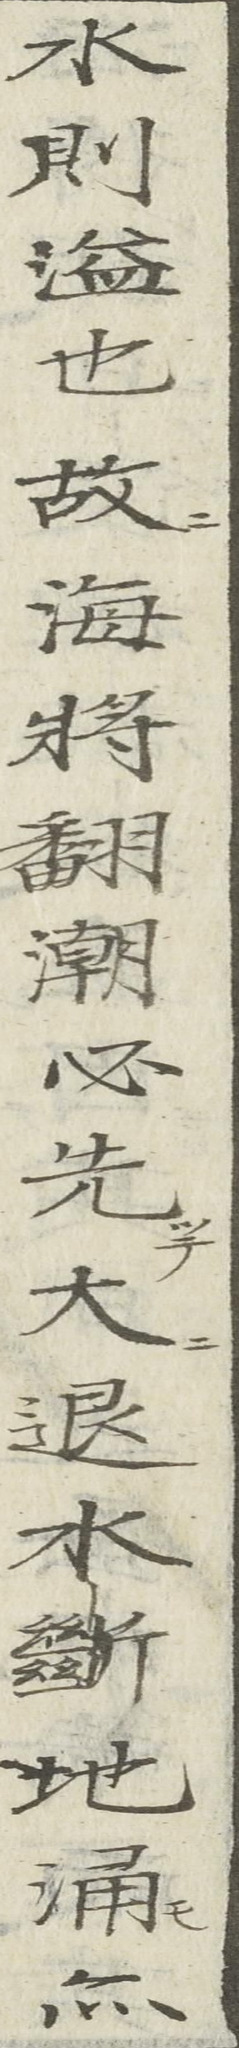水則溢也故海将翻溯必先大退水断地涌亦
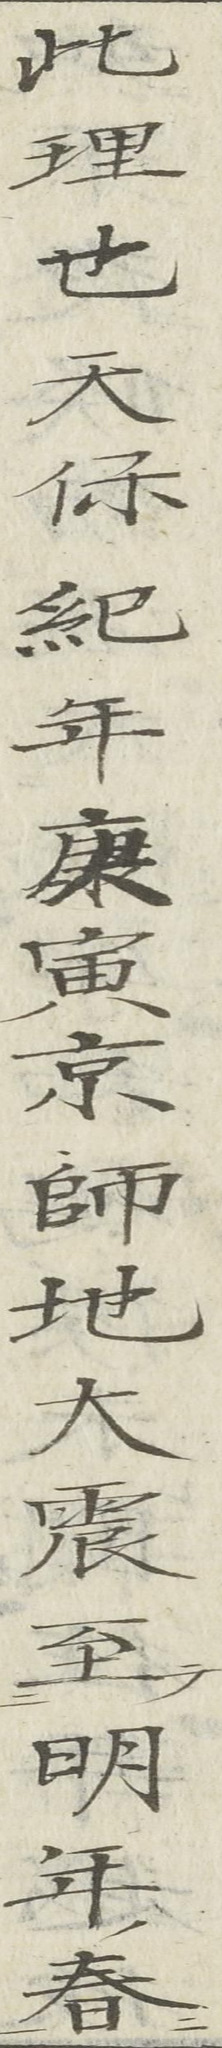此理也天保紀年庚寅京師地大震至明年春
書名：海翻考　全
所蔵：東京大学地震研究所図書室 Earthquake Research Institute Library, The University of Tokyo, JAPAN
